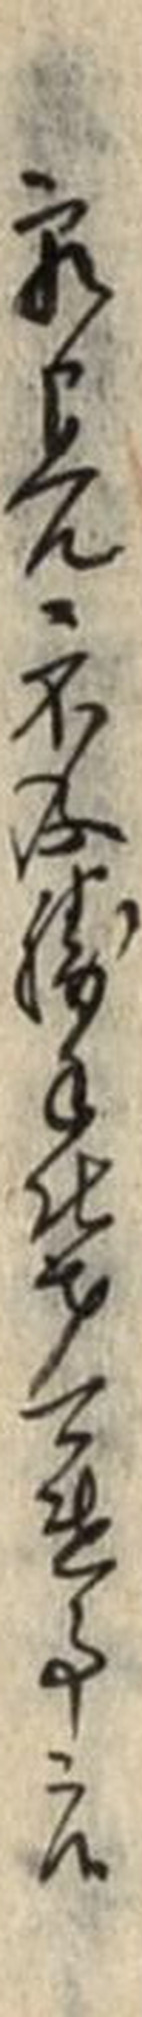願申上るに不及勝手次第可遣事に候
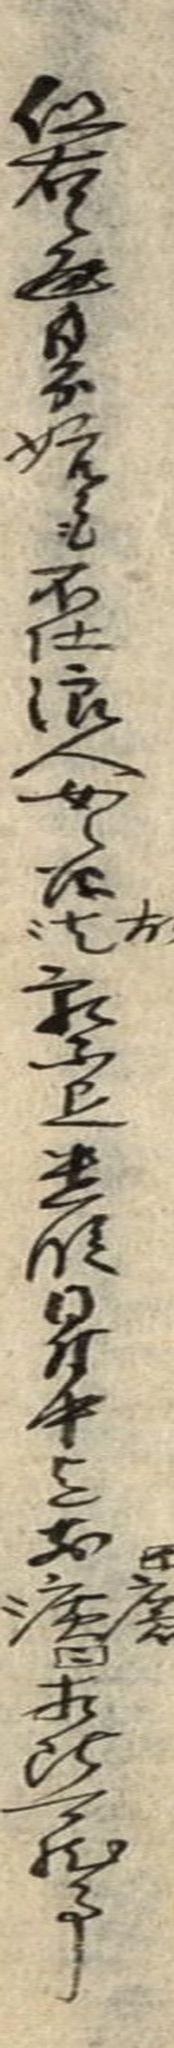但右之通自分娘にも不仕浪人女之儀は願不申上遺段目付中迄前廉相断可然事
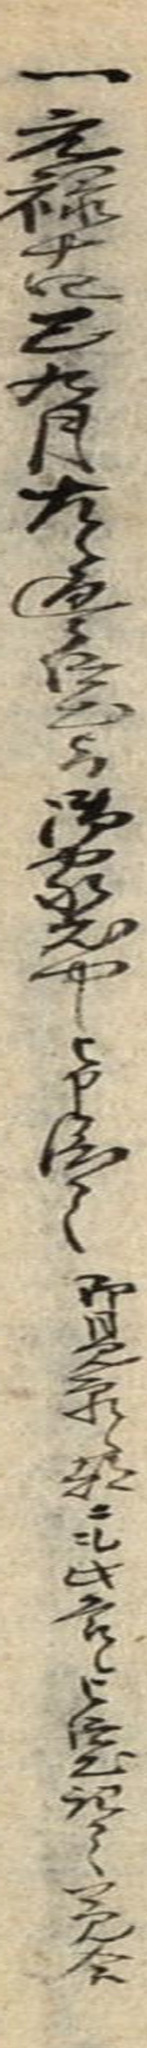一元禄十四巳九月左之通被仰出旨御家老中被申渡之御目見之部にも此節被被仰出記之可見合
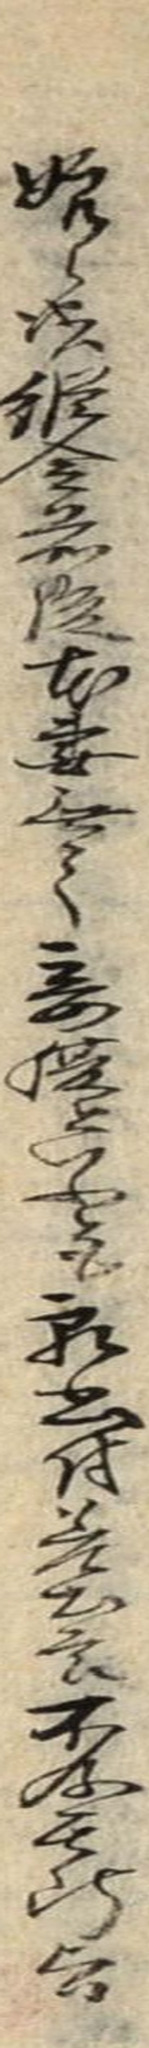娘之儀は仮令前後本妻無之妾腹といふとも願書付差出節不及其断旨

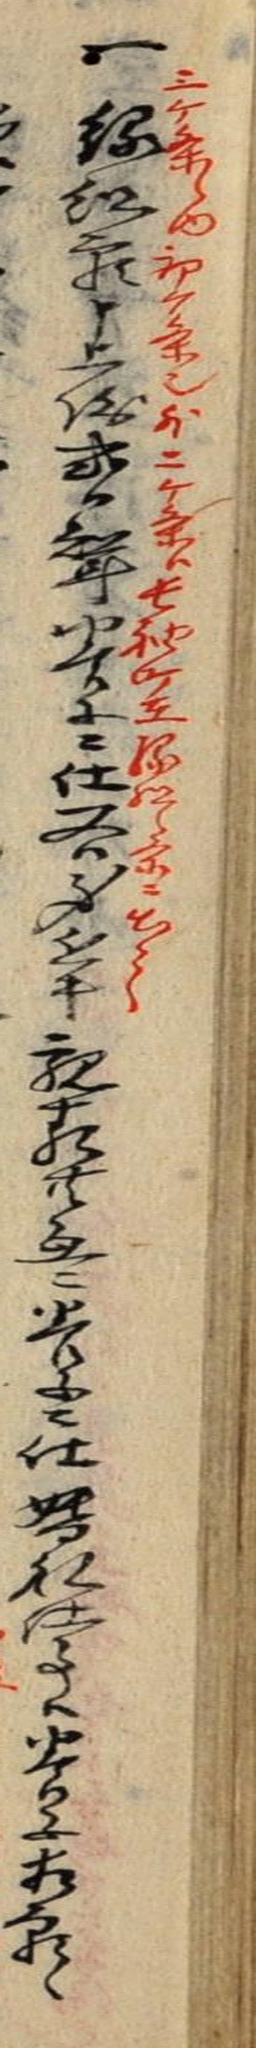一縁組願申上儀或は聟養子に仕又は身近キ親類共互に養子に仕婚礼仕事は養子相願之
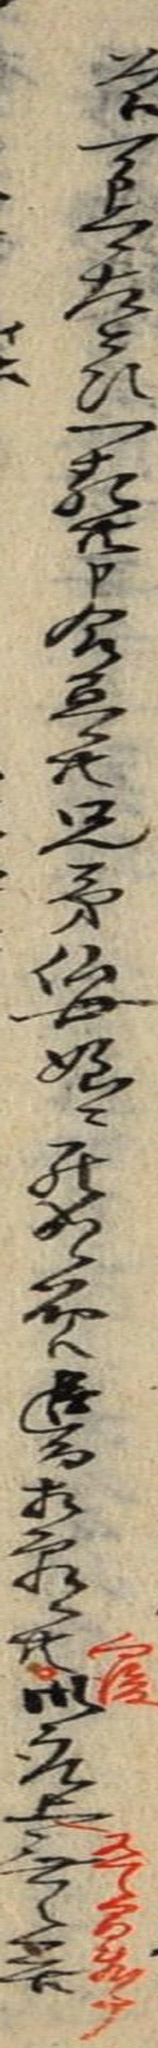節可申上候たとひ一類共申合置候共兄弟伯母娘に罷成候筋は追而相願候共◦向後御取上無之筈
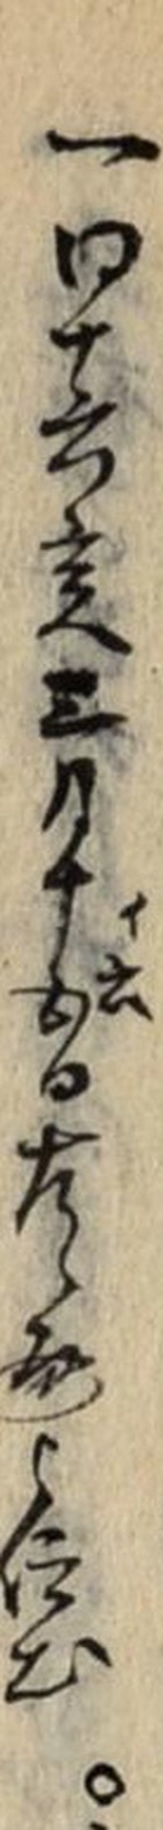一同十六亥三月十五日左之通被仰出
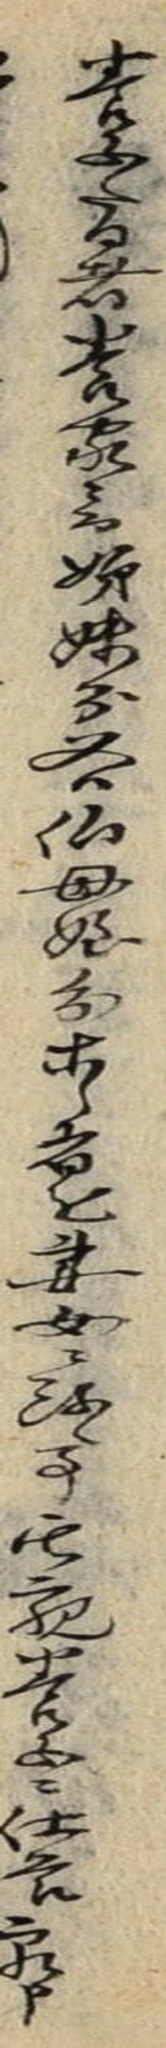養子たる者養家に而姉妹分又は伯母娘分等之者を妻女に致候事其親養子に仕節願申
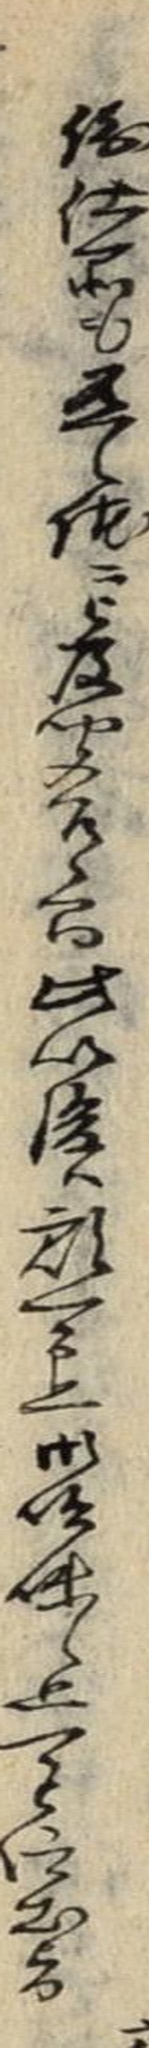儀仕品も有之体に被及聞召候間此以後は願可申上御吟味之上可被仰出旨
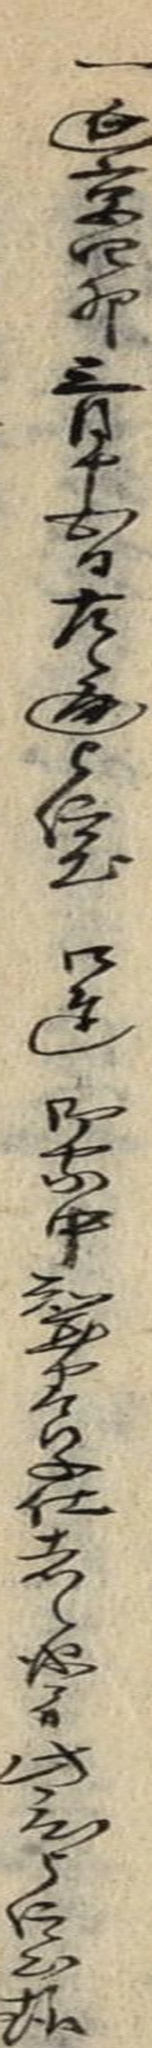一延享四卯三月十五日左之通被仰出口達御家中聟養子仕者之儀に付此度被仰出趣
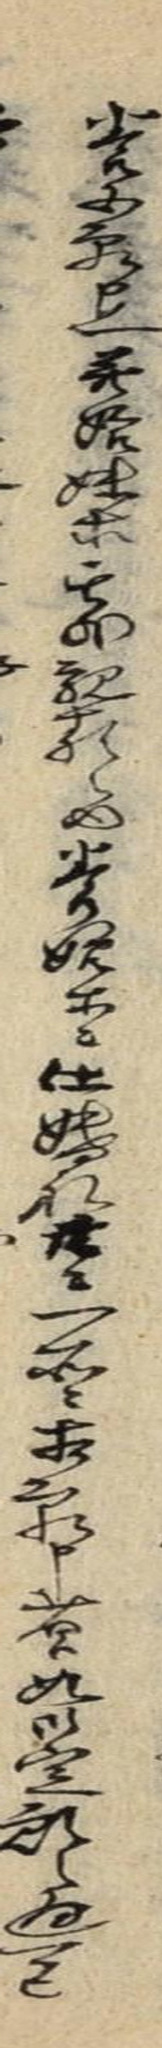養子願申上并娘妹等其外親類之内養娘等に仕婚礼共に一所に相願申者は如御定願之通可被
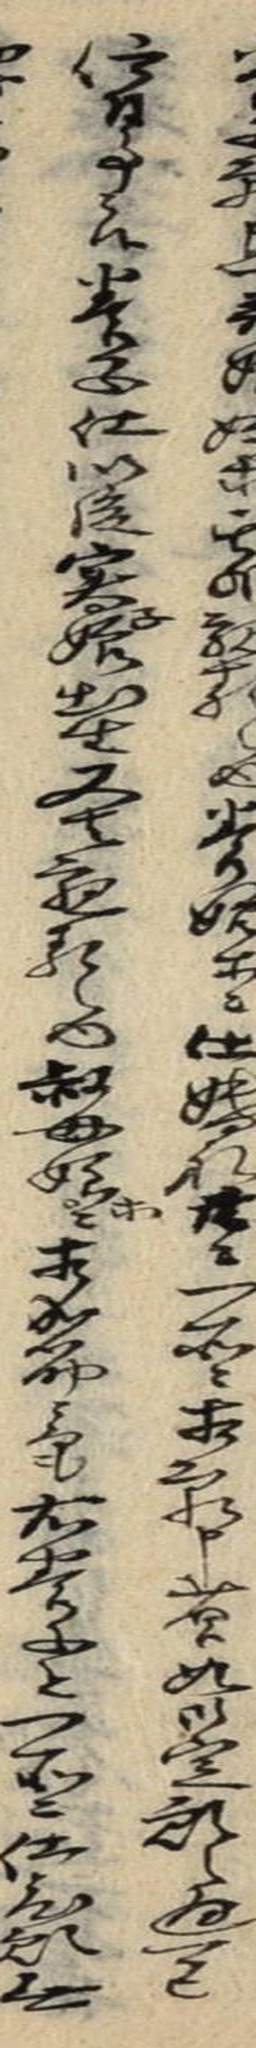仰付事に候養子仕以後実子娘出生又は親類之内叔母娘◦に相成筋に而も右養子と一所に仕度願無
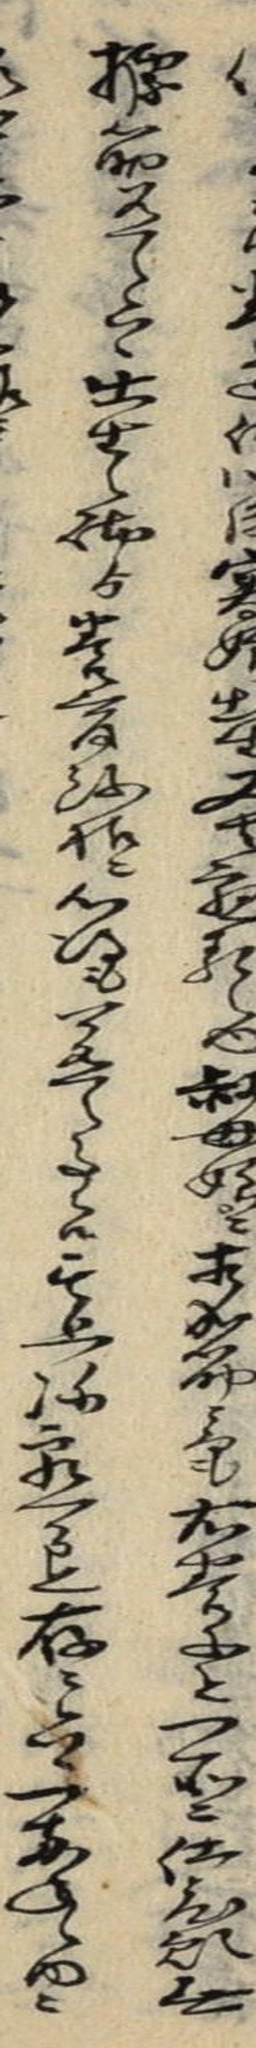拠筋有之候はゝ出生之砌ゟ養育致様に心得も可有之事に候其上弥願可申上存に候はゝ一両年之内に
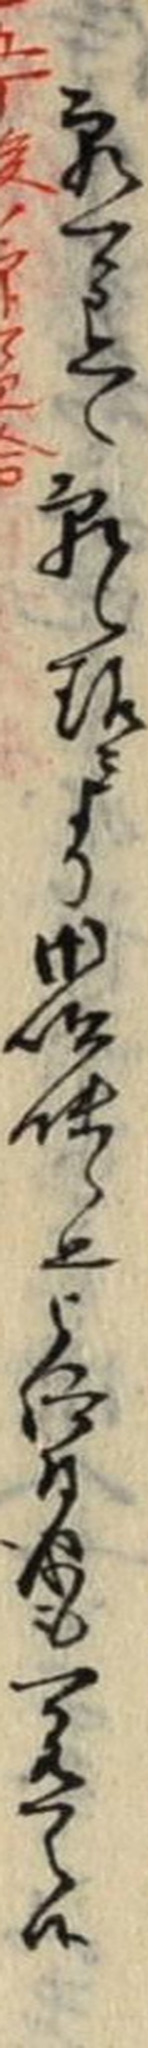願可申上候願之趣により御吟味候上被仰付儀も可有之候
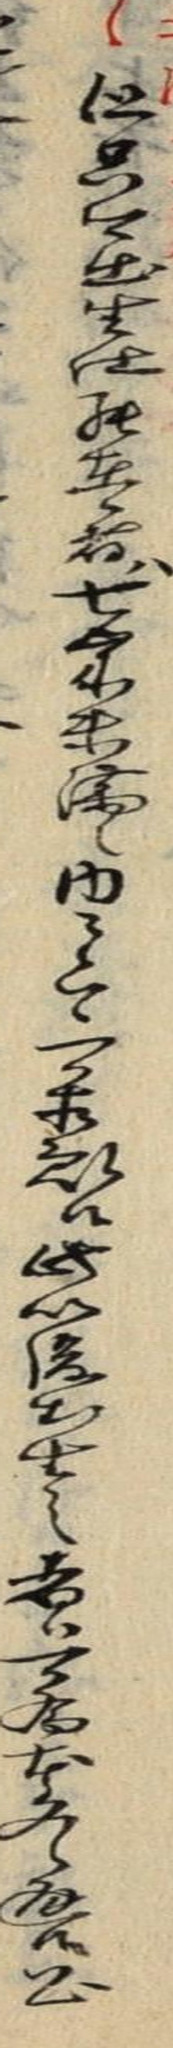但只今出生仕罷在候者は七歳未満之内に候はゝ可相願候此以後出生之者は可為本文之通候以上
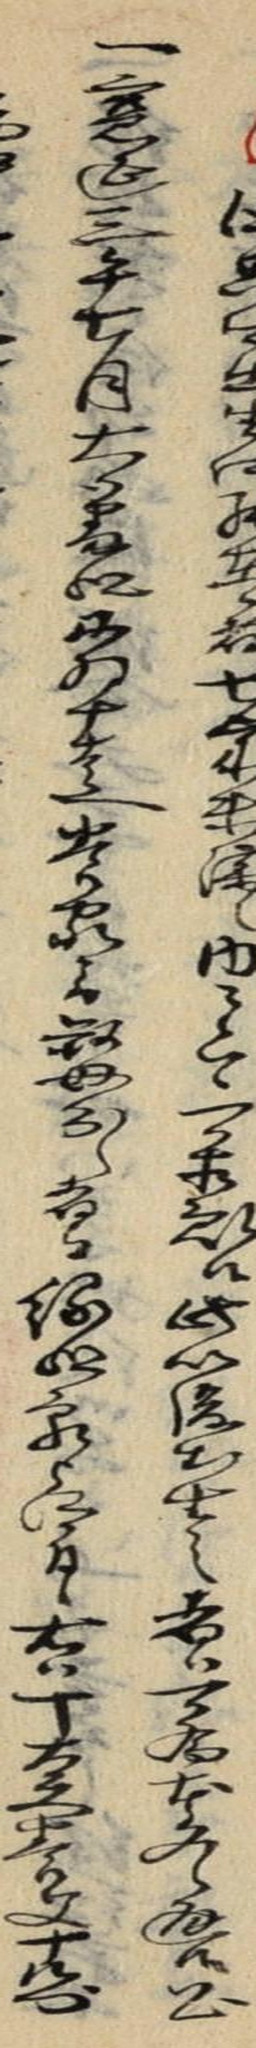一寛延三午七月大御番組丹羽十太夫養家に而叔母分之者と縁組願被仰付候右は十太夫養父十左衛門
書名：養子縁組之部
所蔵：福井県文書館 Fukui Prefectural Archives
